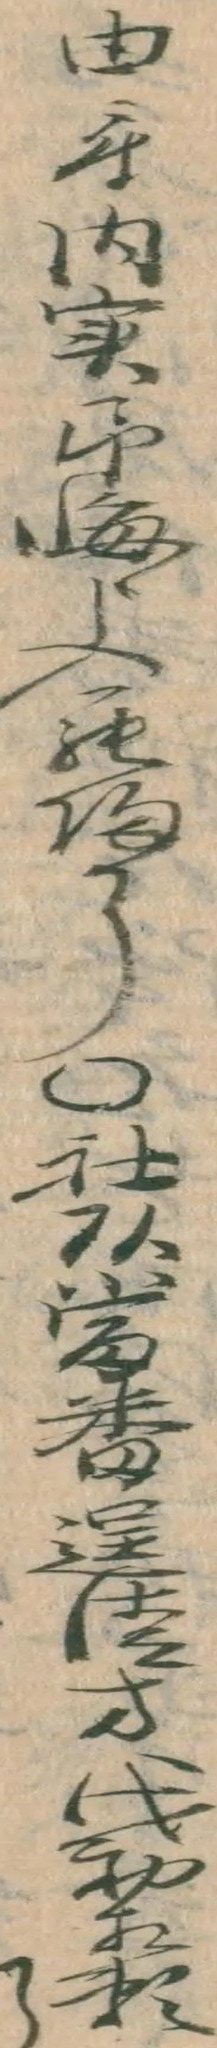由ニ付内実予悔申入罷帰了○社頭當番逞清方代勤相頼了
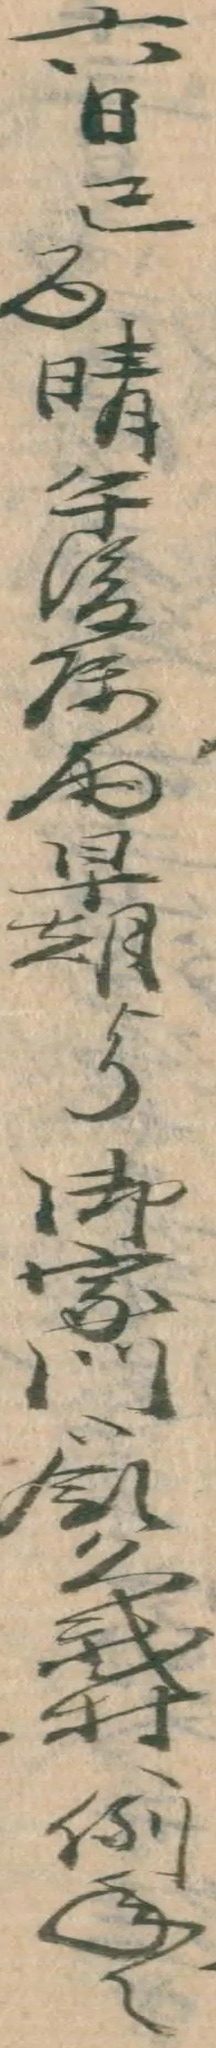六日己酉晴午後属雨早朝より御家門御領久我村へ例年之
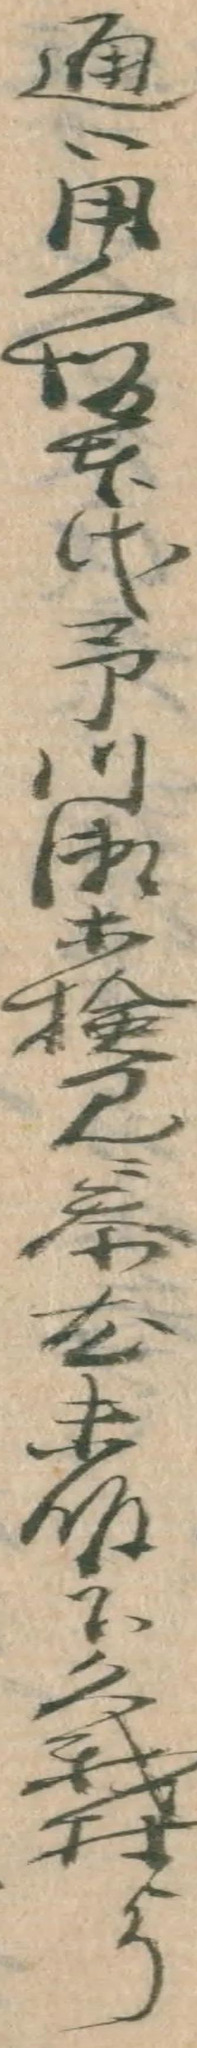通御用人坂本代予川瀬等検見ニ参尤未明下久我村より
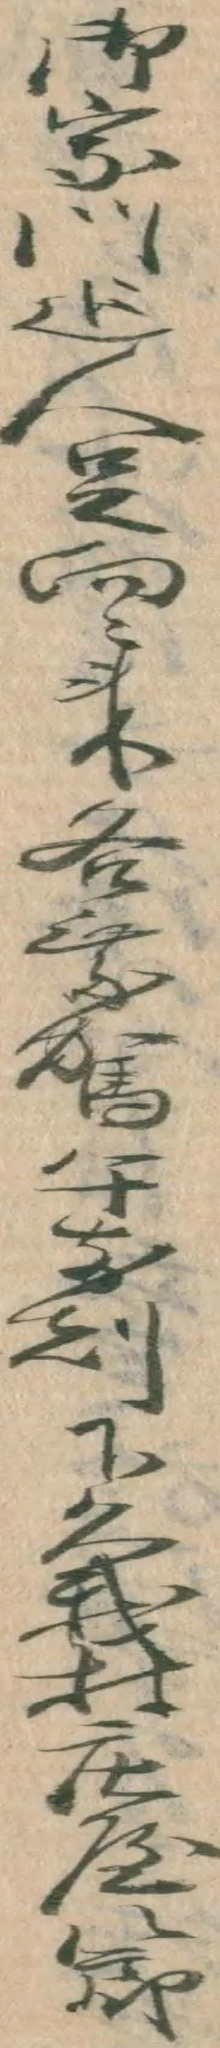御家門迄人足向ニ来各乗駕午前刻下久我村庄屋八郎
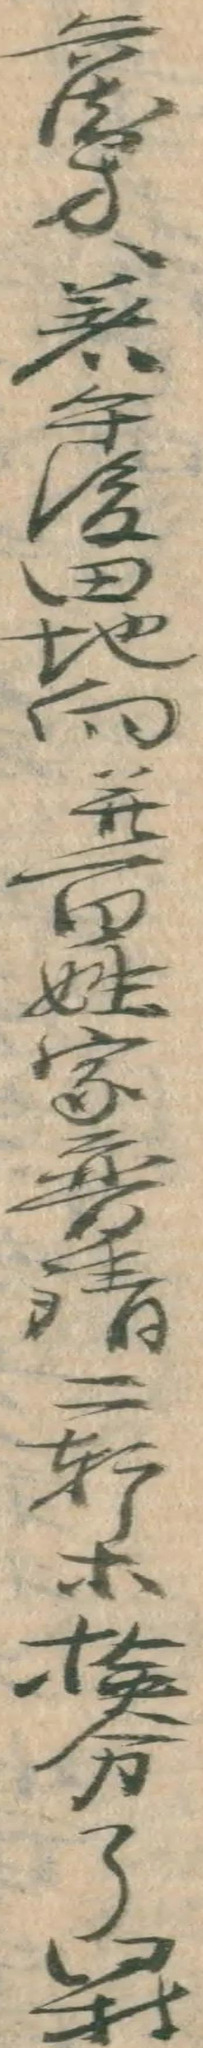兵衛方へ着午後田地向幷百姓家普請二軒等検分了田村
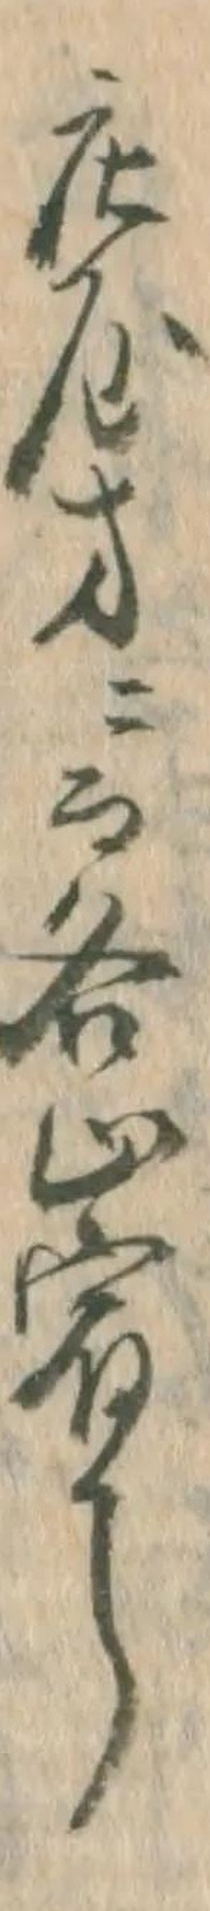庄屋方ニ而各止宿之
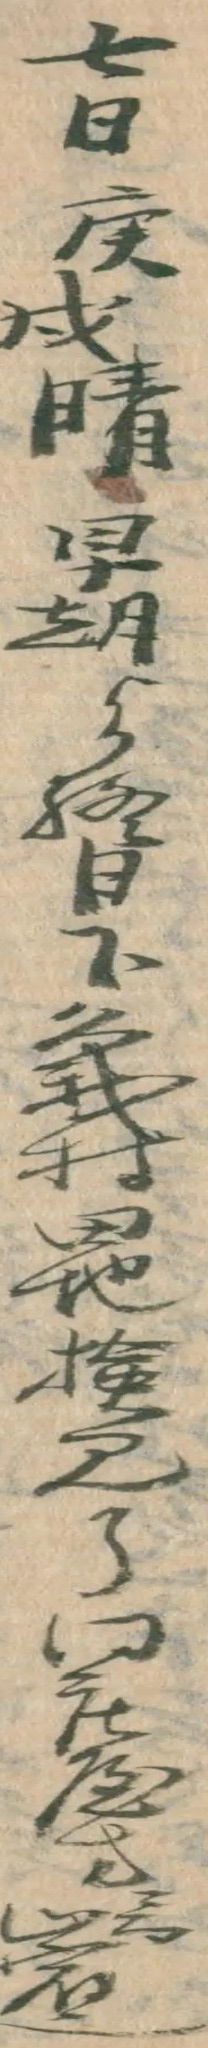七日庚戌晴早朝より終日下久我村田地検見了同庄屋方ニ而止宿也
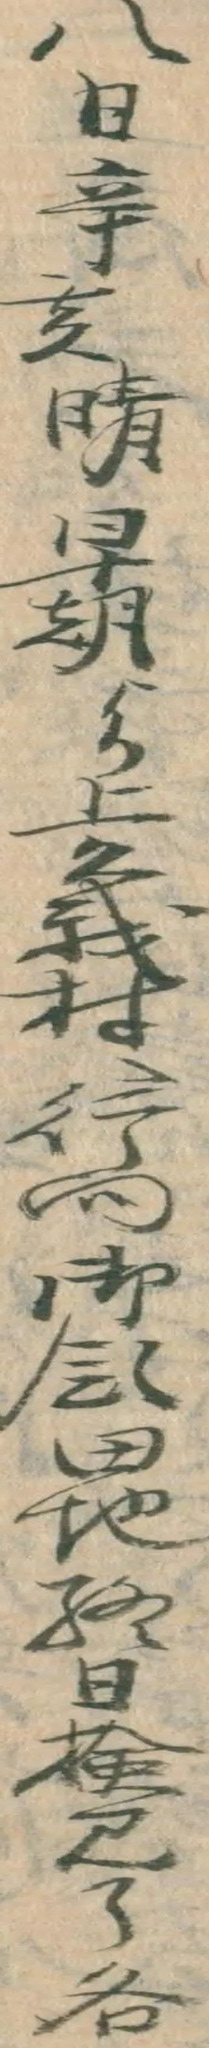八日辛亥晴早朝より上久我村へ行向御領田地終日検見了各
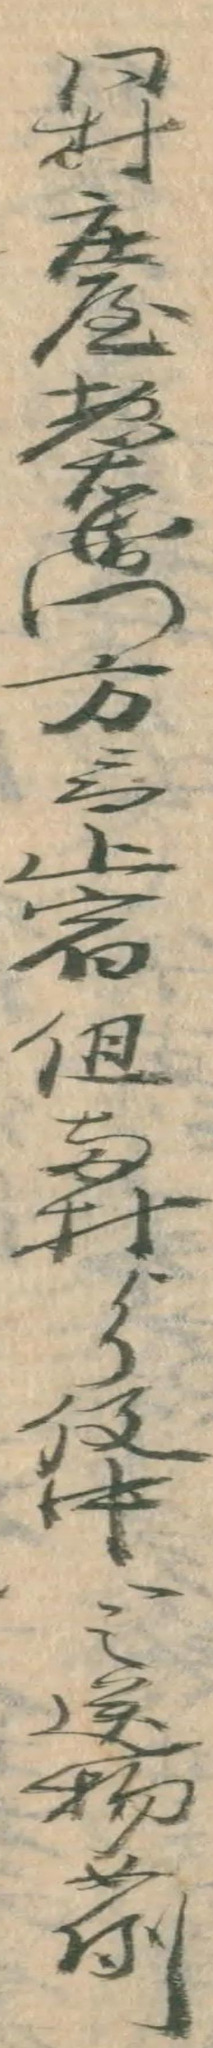同村庄屋惣右衛門方に而止宿但両村より役中へ之送物如例
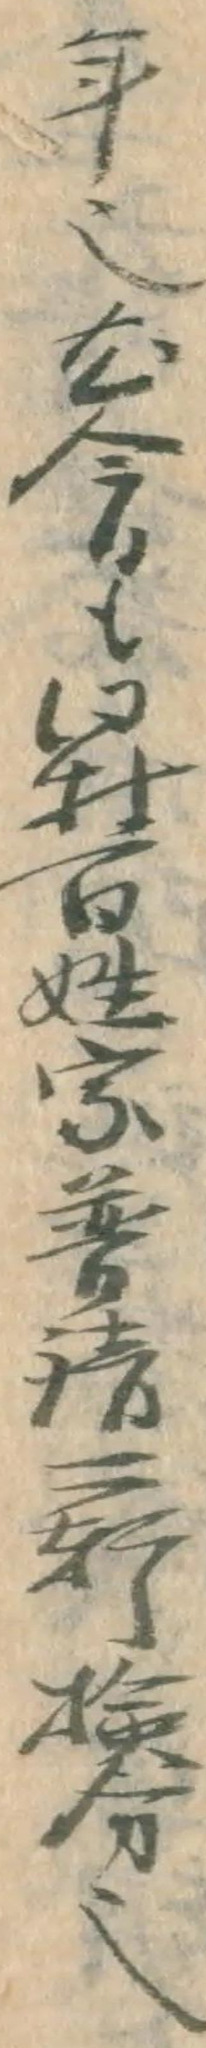年也尤今日も同村百姓家普請二軒検分也

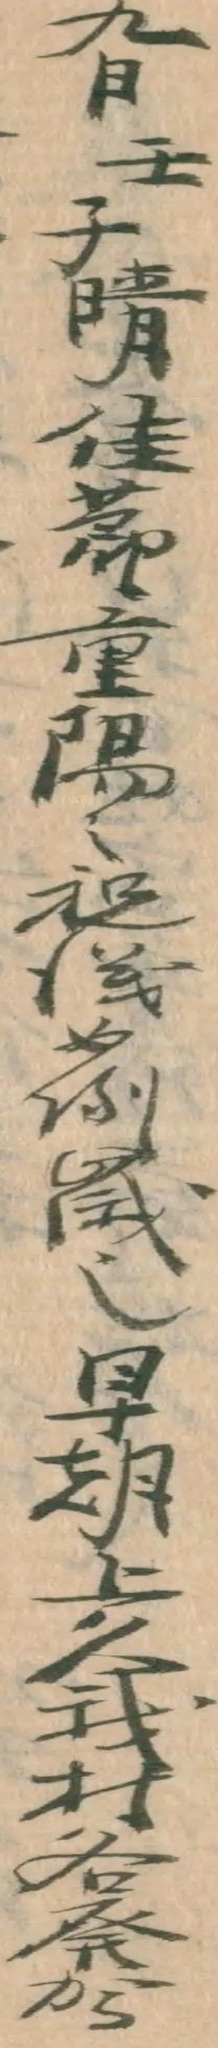九月壬子晴佳節重陽之祝儀如例歳也早朝上久我村各発駕
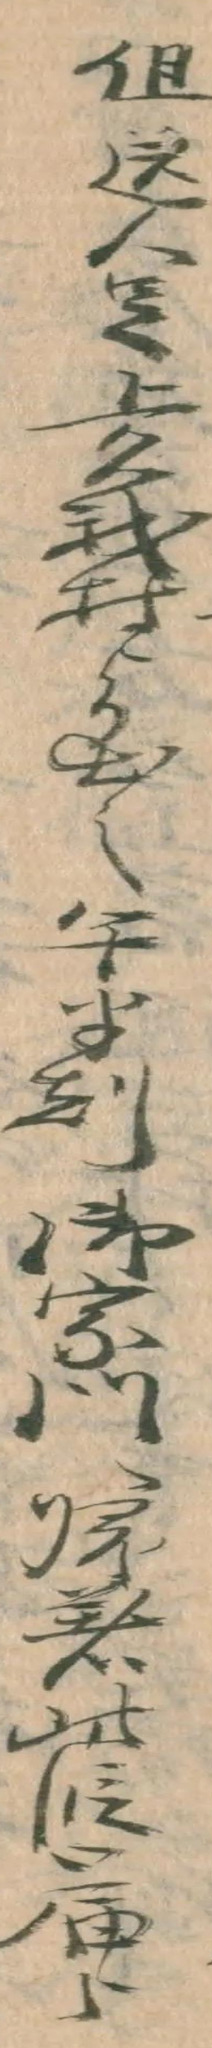但送人足上公我村より出也午半刻御家門へ帰着此段御届申候
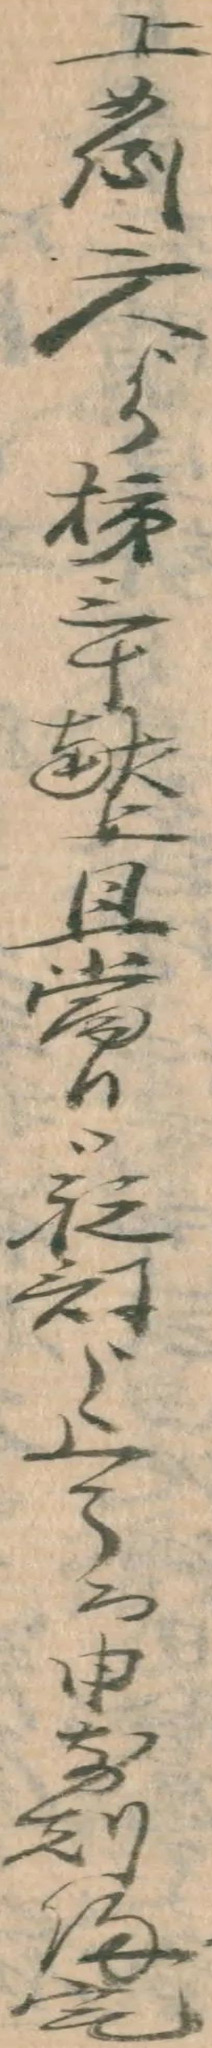上如例三人より梯三十献上且當日御祝詞申上了而申前刻帰宅
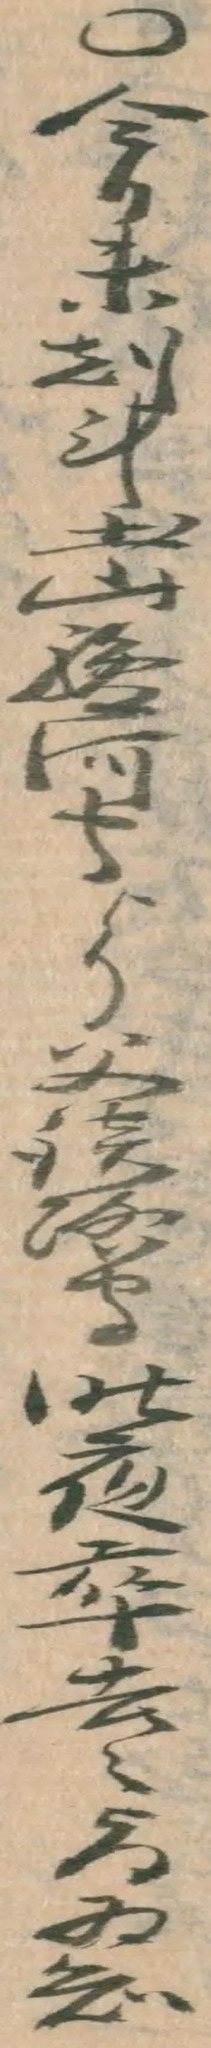○今日未刻斗土山駿河守より父淡路守昨夜卒去之旨為知
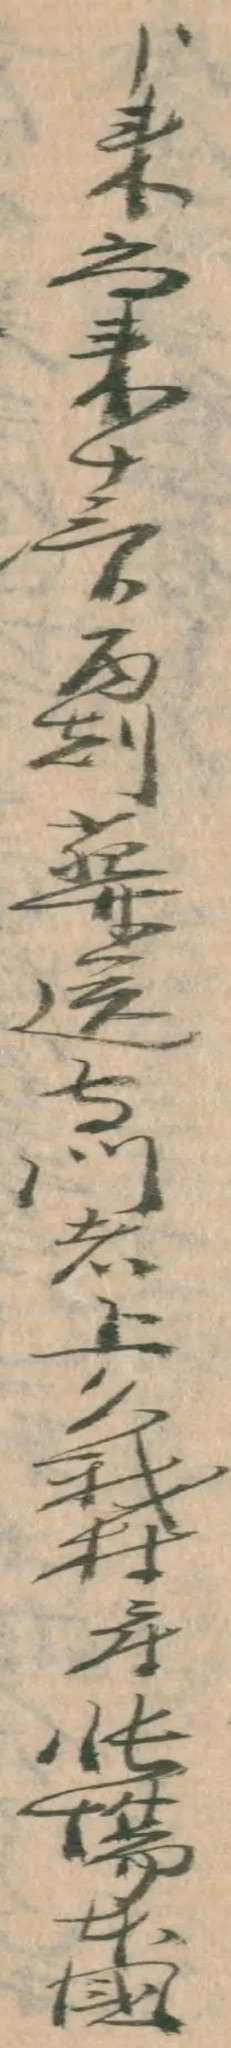申来尚来十三日酉刻葬送寺門者上久我村ニ付帳場本國
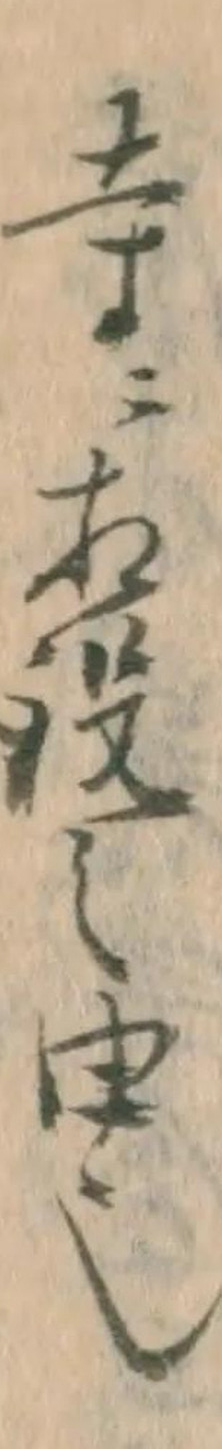寺ニ相設之由也
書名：賀茂社記録. 第65冊
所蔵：国立国会図書館 National Diet Library, JAPAN
